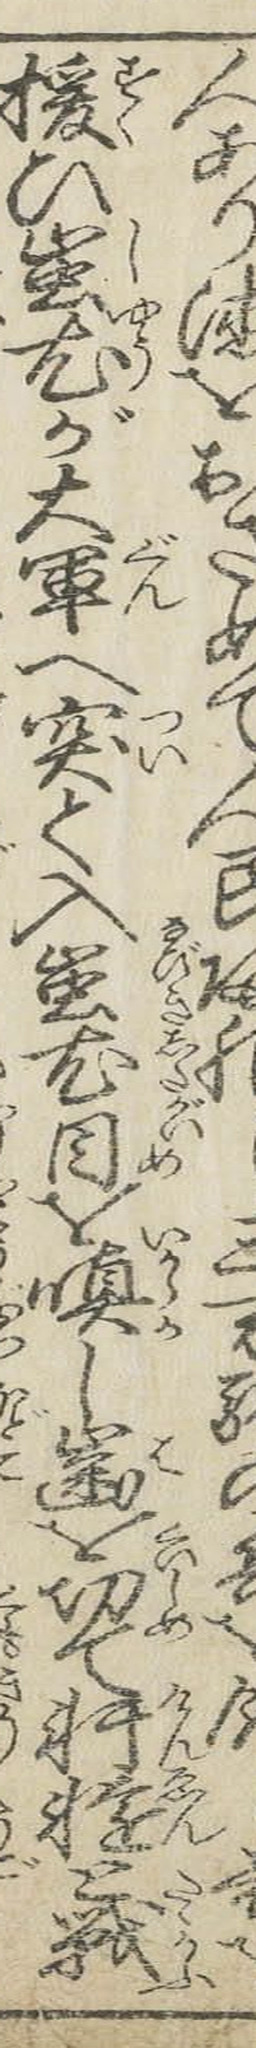援ひ蚩尤が大軍へ突て入蚩尤目を嗔し歯を切て軒轅と戦
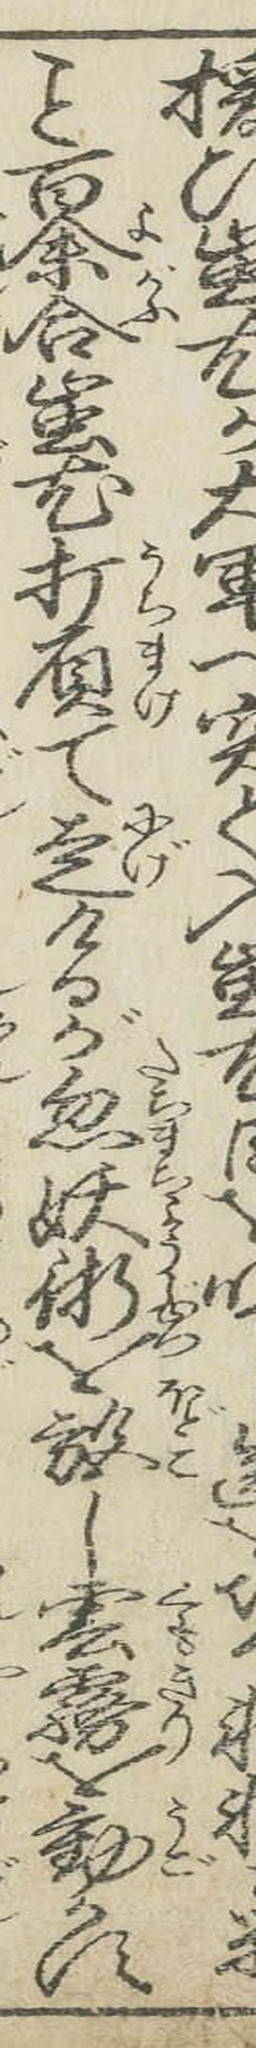こと百余合蚩尤打負て走けるが忽妖術を施し雲霧を動かす
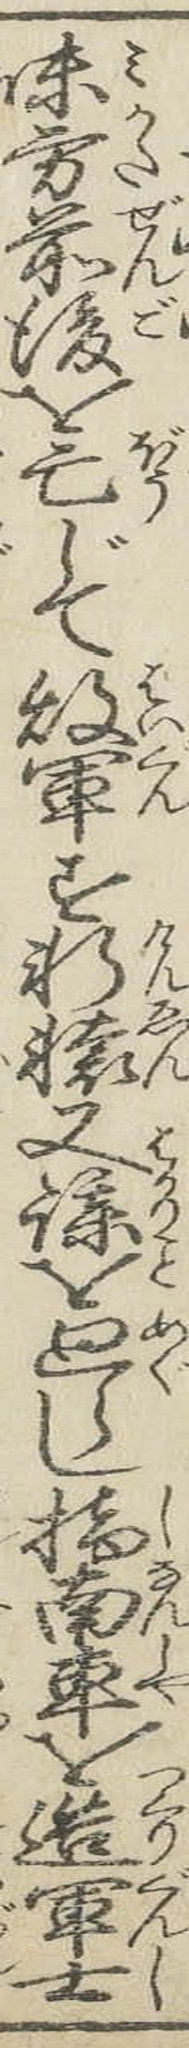味方前後を亡じて敗軍す軒轅又謀を廻らし指南車を造軍士
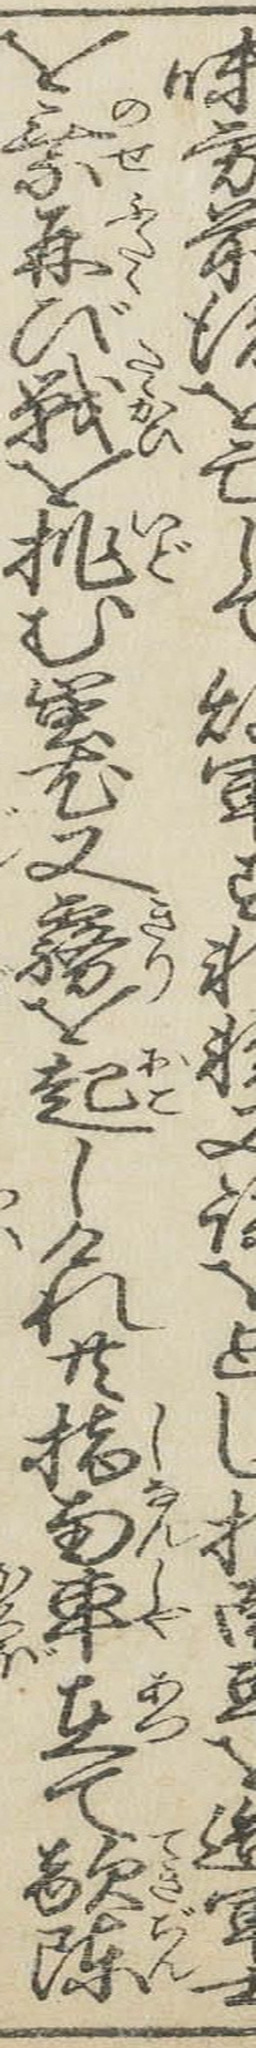を乗再び戦を挑む蚩尤又霧を起しけれ共指南車在て敵陣
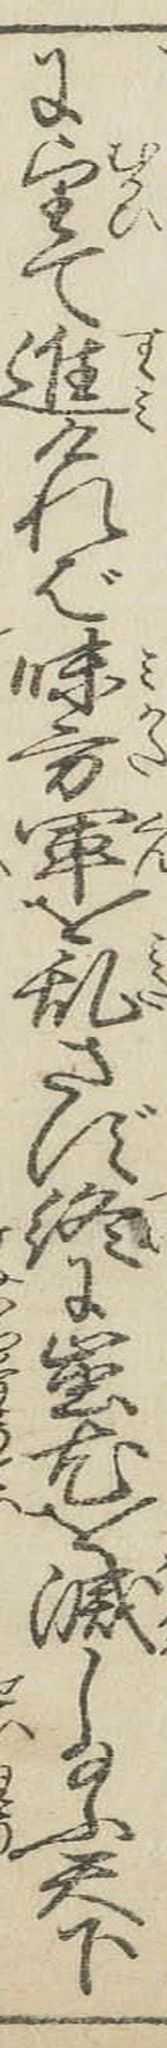に望て進ければ味方軍を乱さず終に蚩尤を滅し給ふ天下
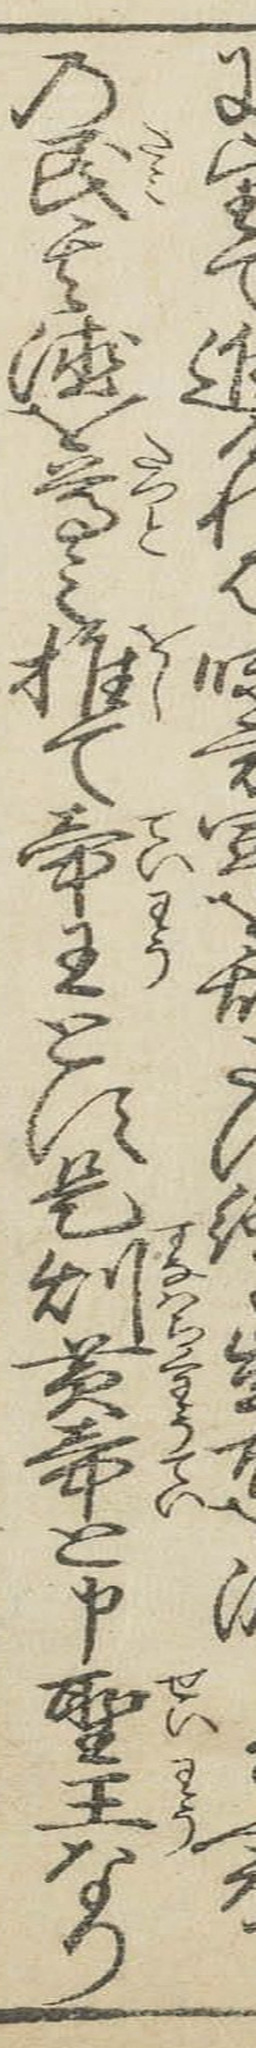の民其徳を尊み推て帝王とす是則黄帝と申聖王なり
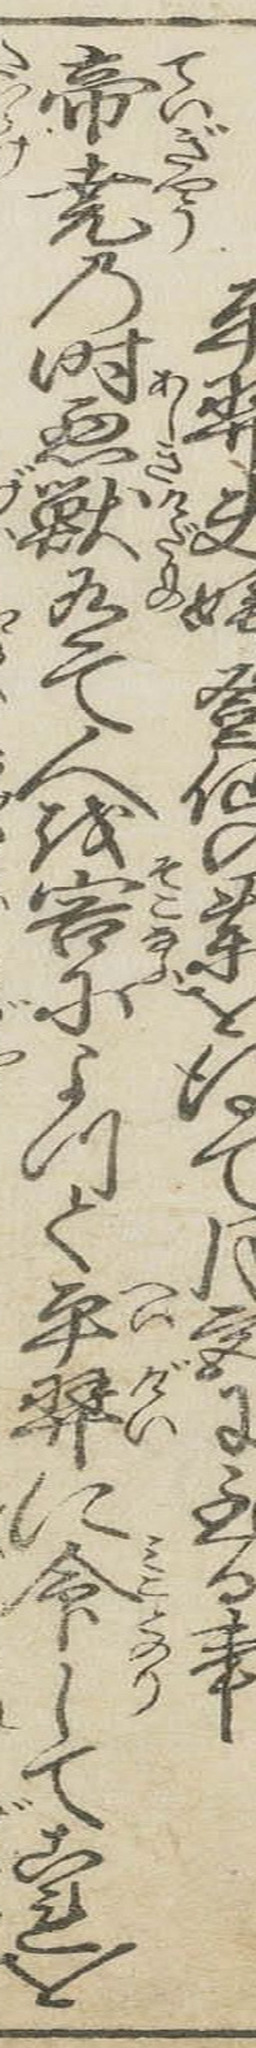帝尭の時悪獣有て人を害によつて平羿に命してこれを
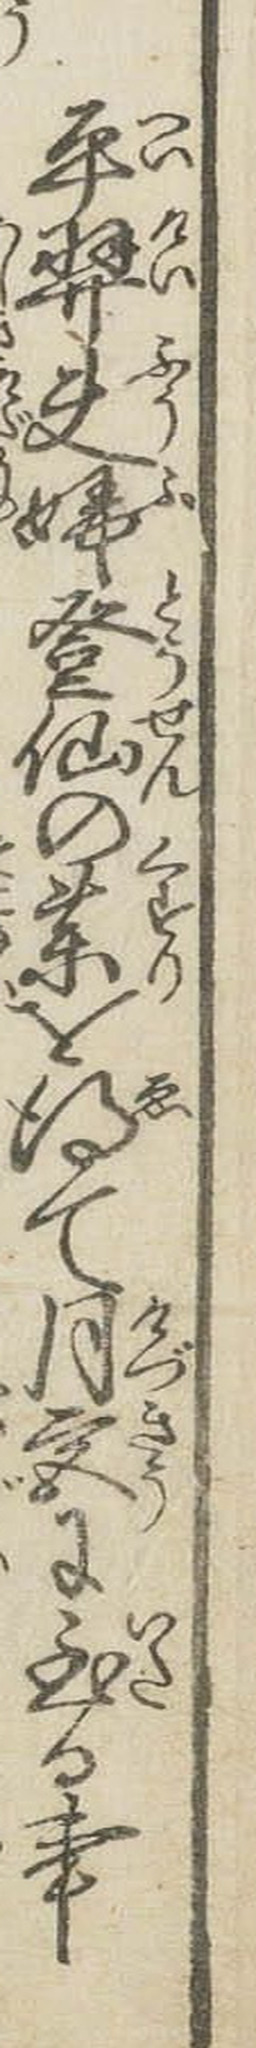平羿夫婦登仙の薬を得て月宮に至る事
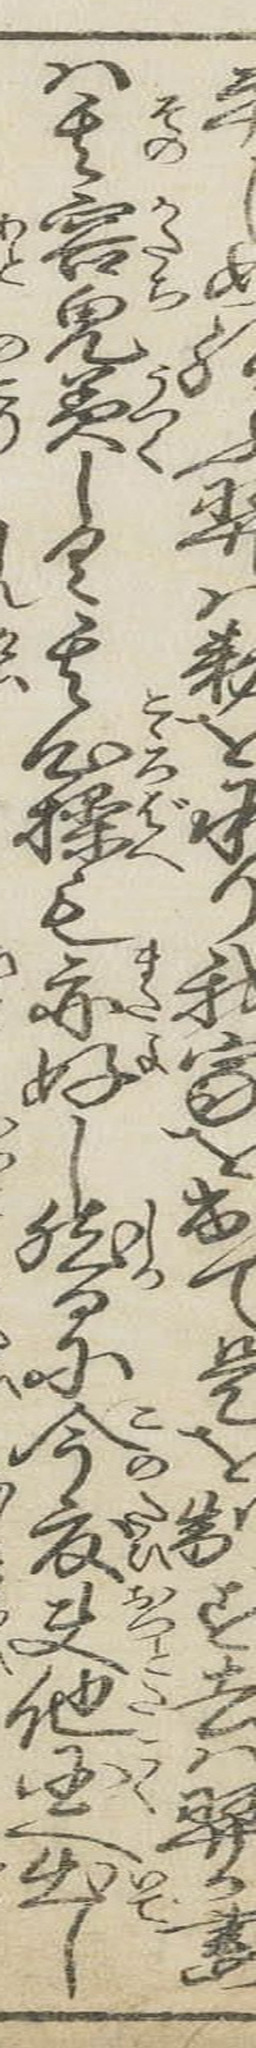は其容皃美しく其心様も亦好し然るに今度夫他国へ出し
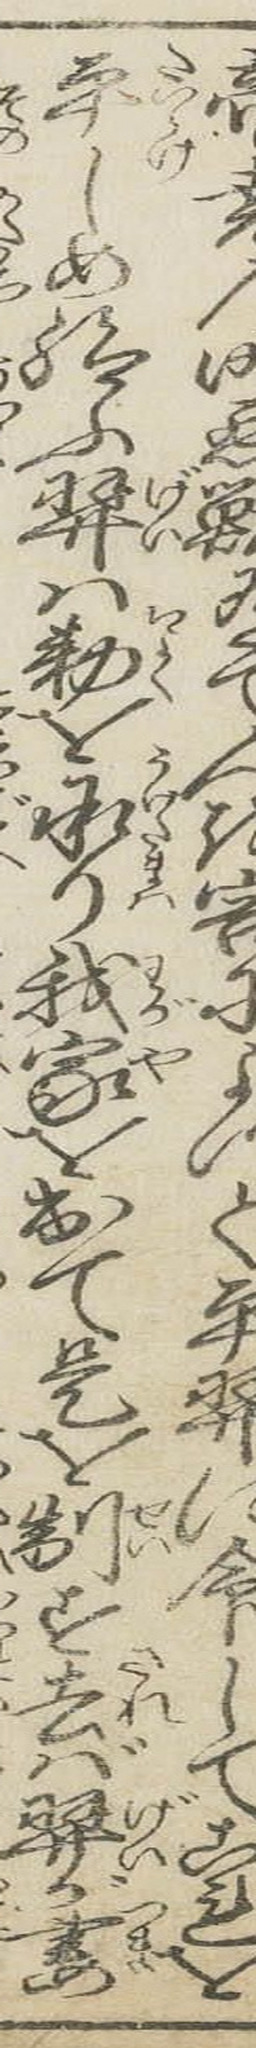平しめ給ふ羿は勅を承り我家を出て是を制す去ば羿が妻
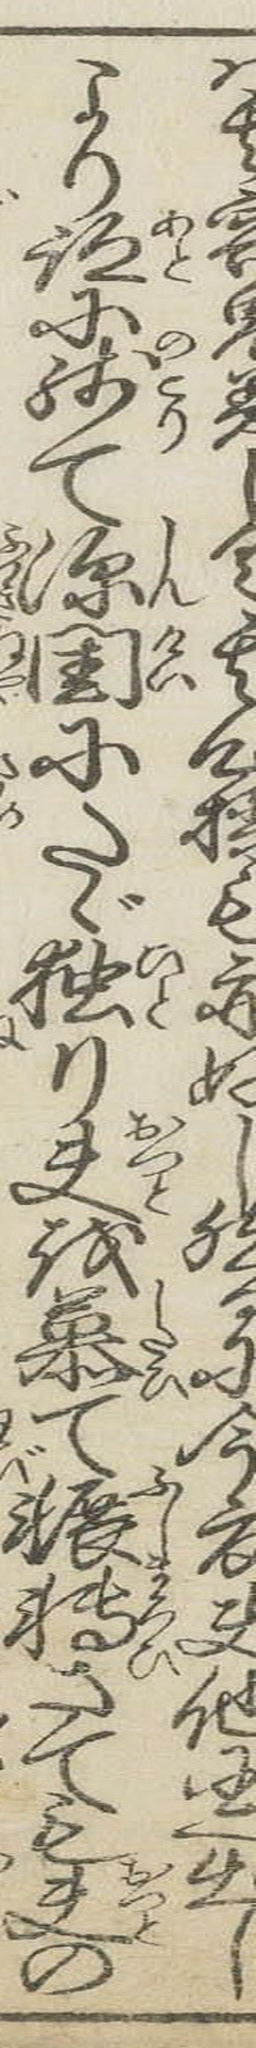より跡に残て深閨にたゞ独り夫を慕て輾転さても夫の
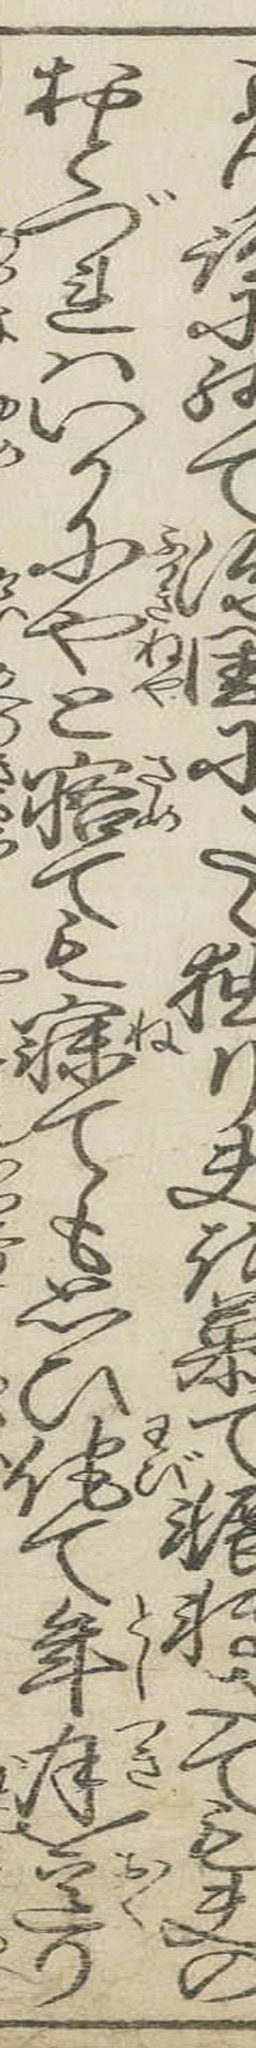おとづれはいかにやと寤ても寐ても思ひ侘て年月を送り
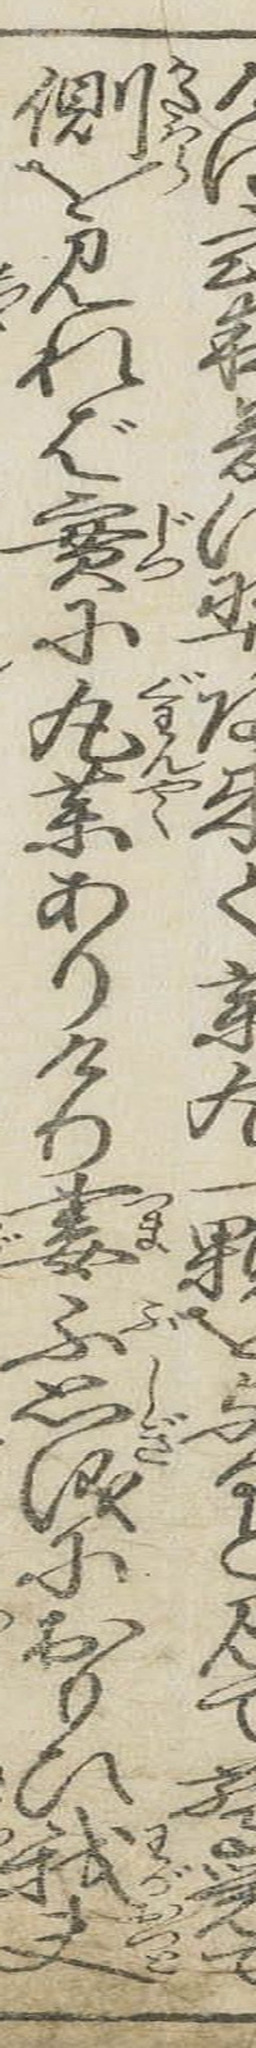側を見れば実に丸薬ありけり妻不思議におもひ我夫
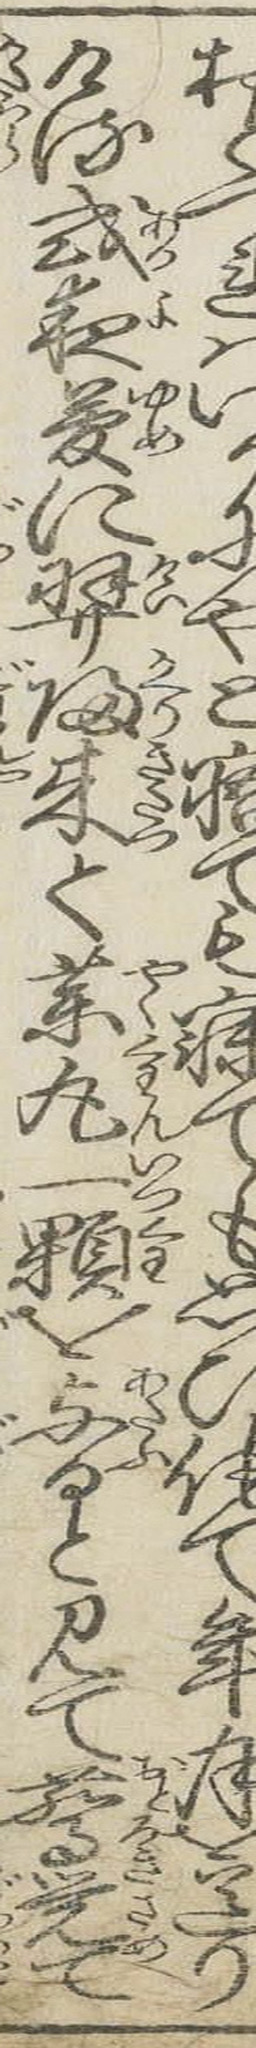ける或夜夢に羿帰来て薬丸一顆を与ると見て驚覚て
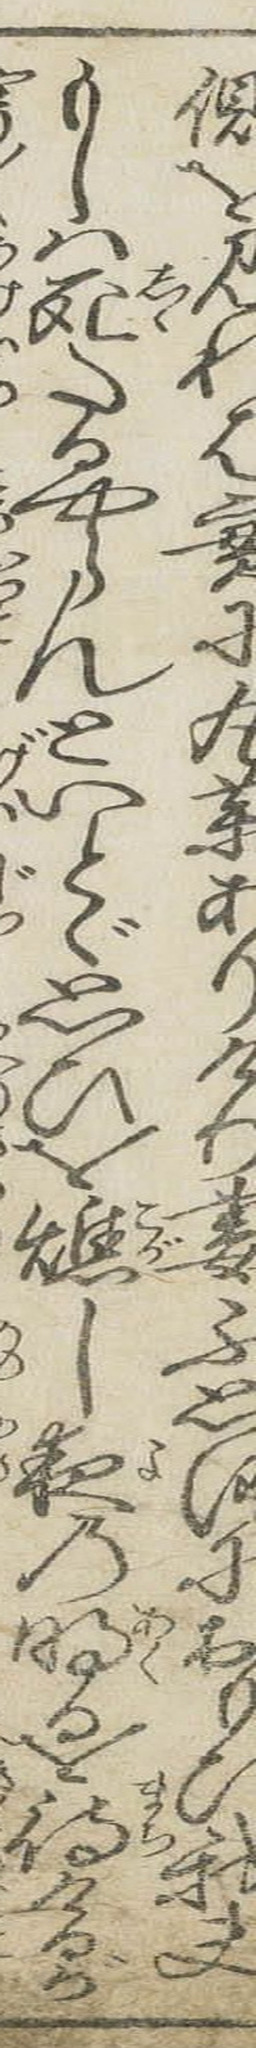もしは死たるやらんといとゞ思ひを燋し夜の明るを待けるが
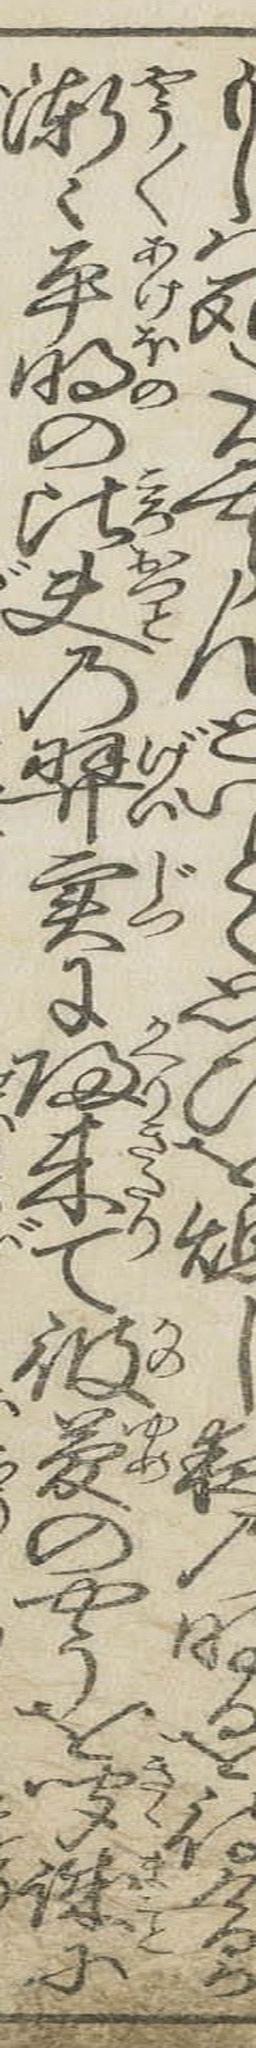漸々平明の比夫の羿実に帰来て彼夢のやうを聞誠に
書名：絵本写宝袋 9巻 4之巻
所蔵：東京学芸大学教育コンテンツアーカイブ
